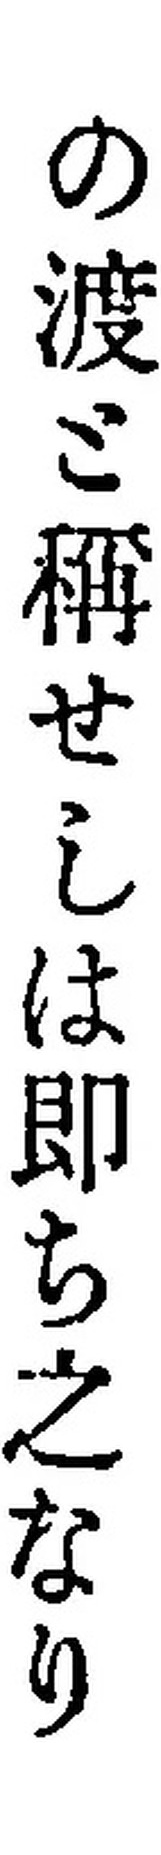の渡と稱せしは即ち之なり
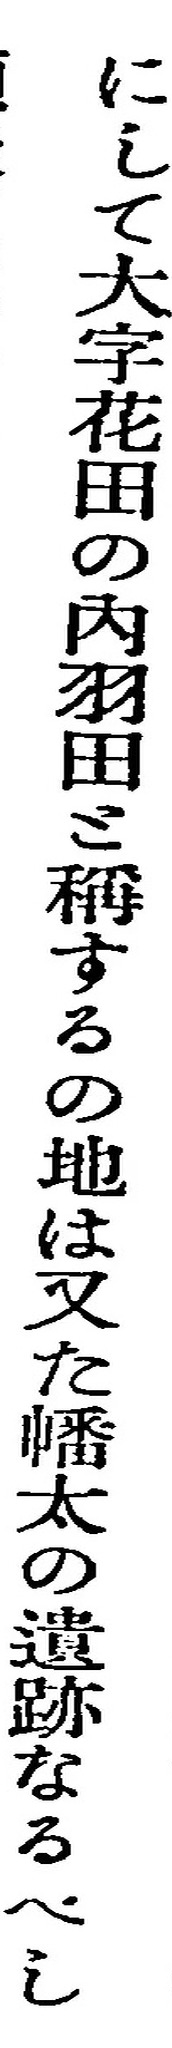にして大字花田の内羽田と稱するの地は又た幡太の遺跡なるべし
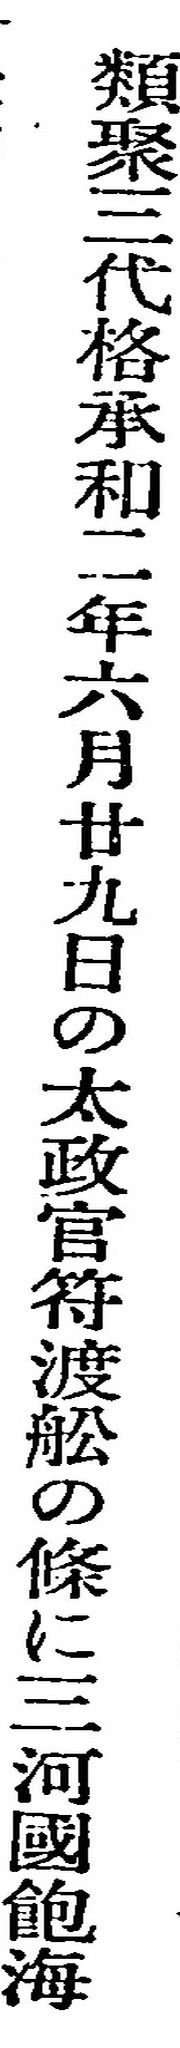類聚三代格承和二年六月廿九日の太政官符渡舩の條に三河國飽海
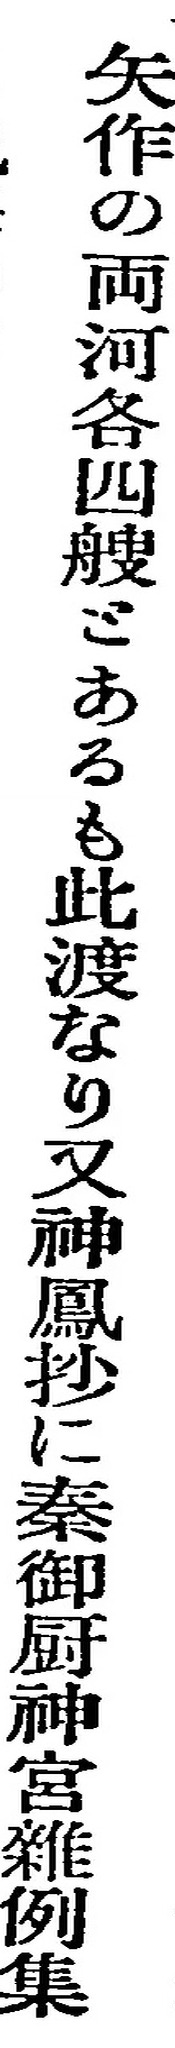矢作の両河各四艘とあるも此渡なり又神鳳抄に秦御厨神宮雜例集
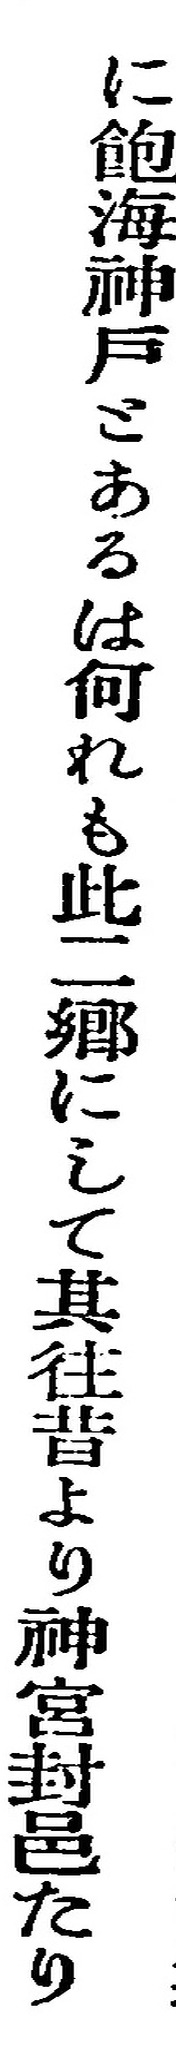に飽海神戸とあるは何れも此二鄕にして其往昔より神宮封邑たり
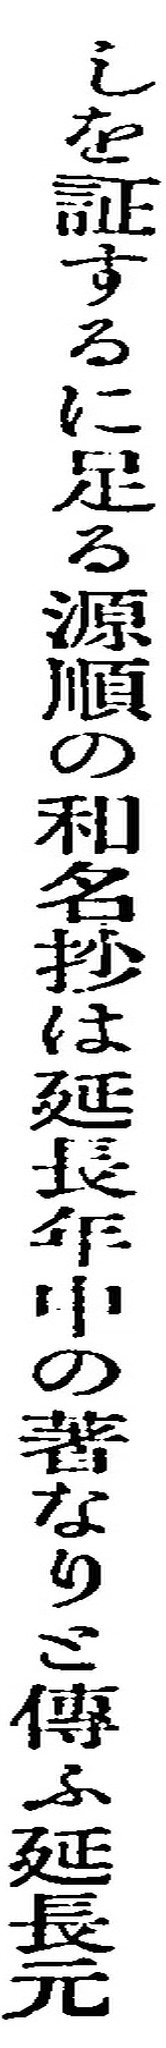しを証するに足る源順の和名抄は延長年中の著なりと傳ふ延長元
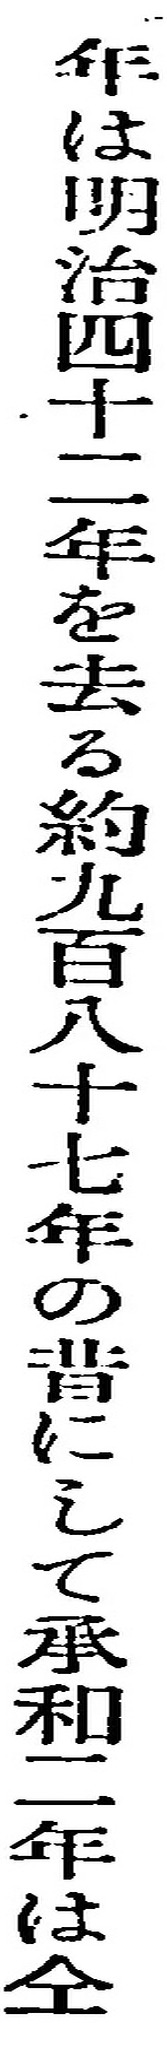年は明治四十二年を去る約九百八十七年の昔にして承和二年は仝
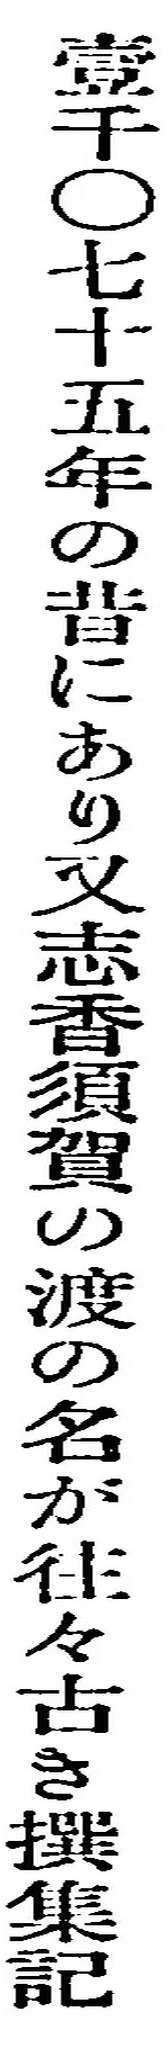壹千〇七十五年の昔にあり又志香須賀の渡の名が往々古き撰集記
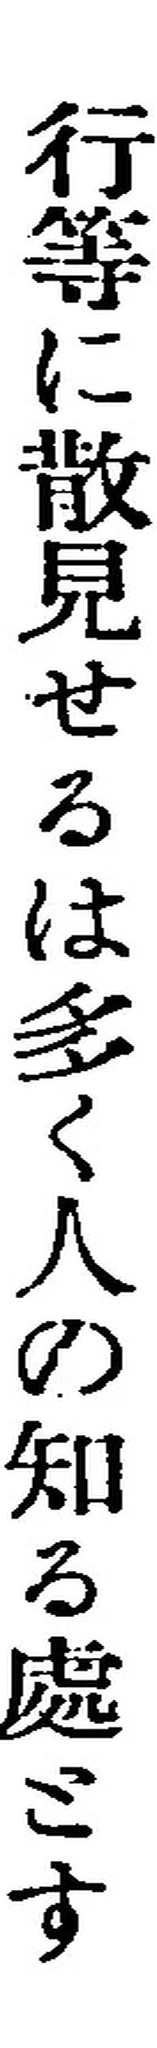行等に散見せるは多く人の知る處とす
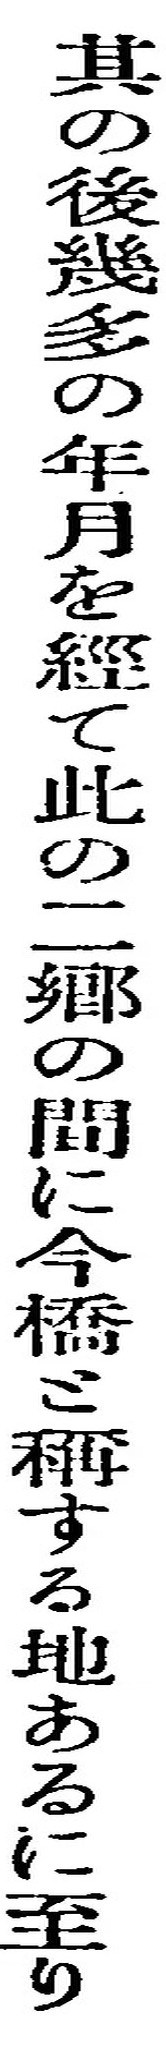其の後幾多の年月を經て此の二鄕の間に今橋と稱する地あるに至り
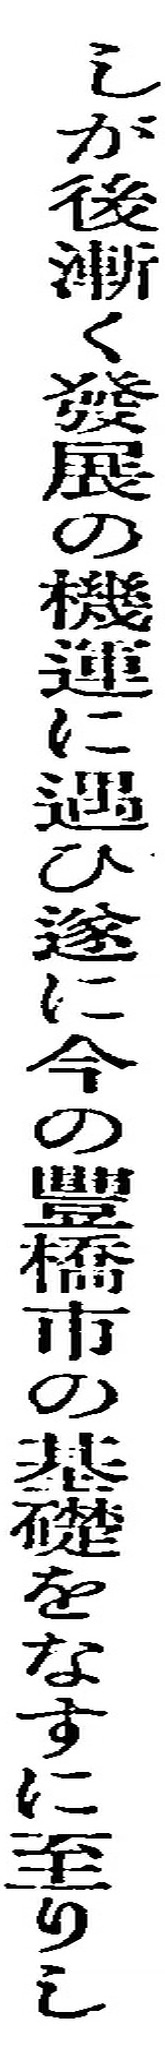しが後漸く發展の機運に遇ひ遂に今の豐橋市の基礎をなすに至りし
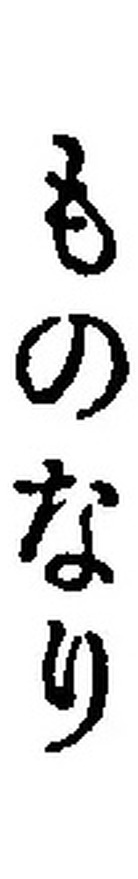ものなり
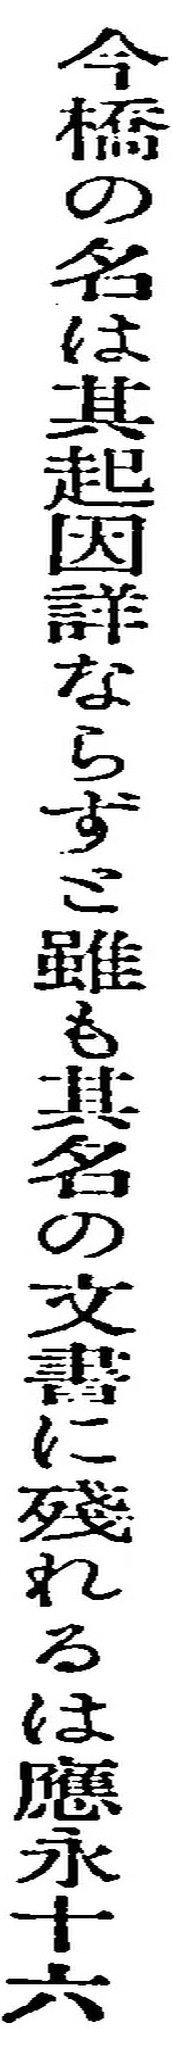今橋の名は其起因詳ならずと雖も其名の文書に殘れるは應永十六
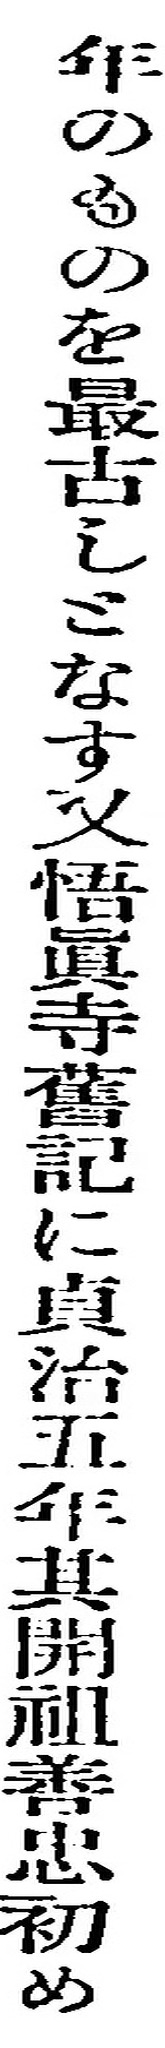年のものを最古しとなす又悟眞寺舊記に貞治五年其開祖善忠初め
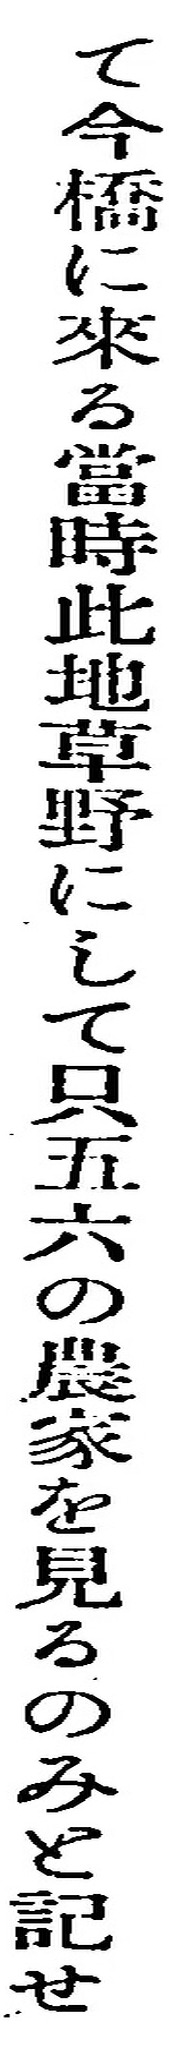て今橋に來る當時此地草野にして只五六の農家を見るのみと記せ
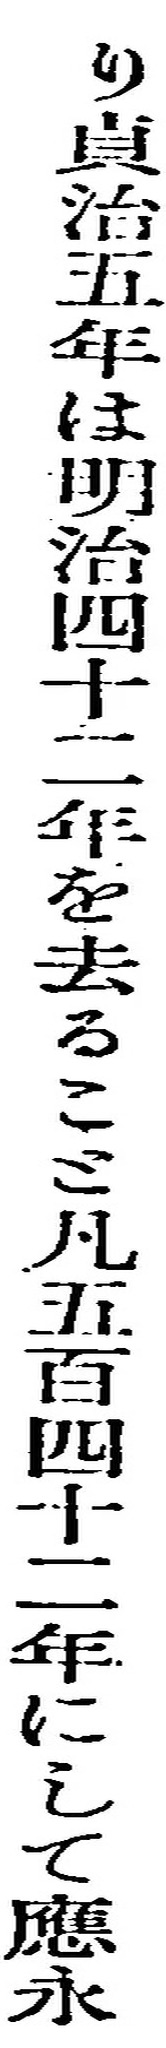り貞治五年は明治四十二年を去ること凡五百四十二年にして應永
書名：豊橋志要
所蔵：国立国会図書館 National Diet Library, JAPAN
